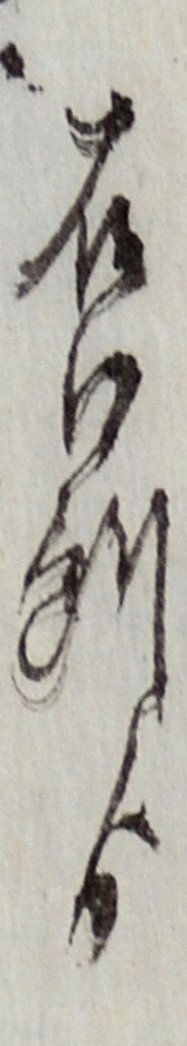右同所江
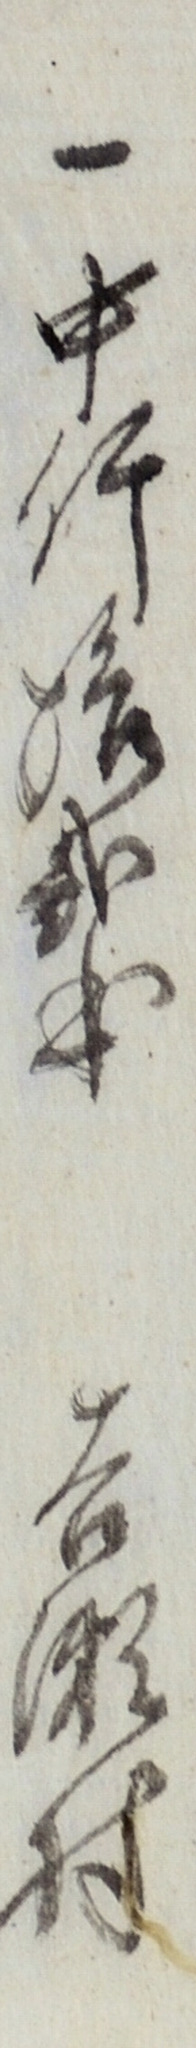一中竹拾弐本吉瀬村
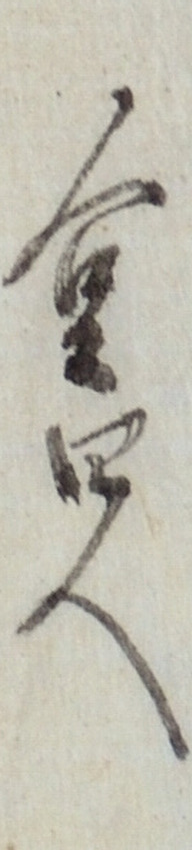人足四人
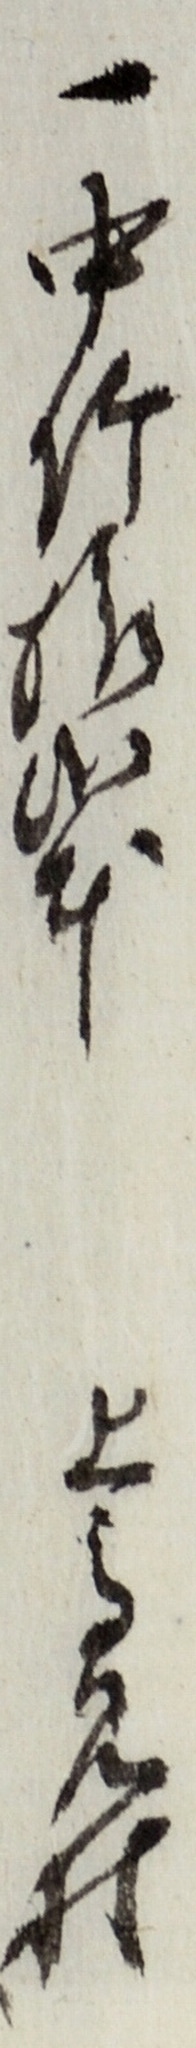一中竹拾弐本上高見村
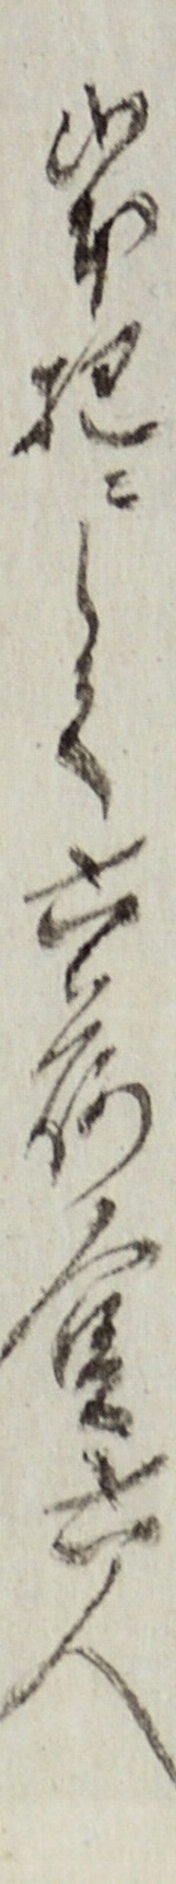弐本把ニして六荷人足六人
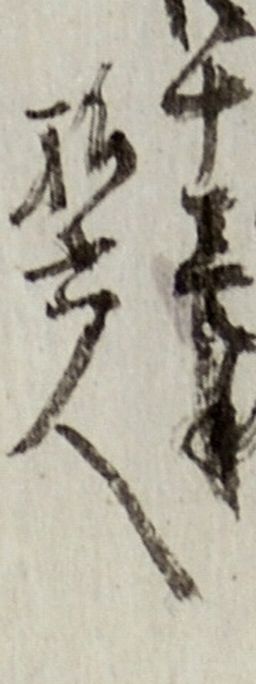拾六人

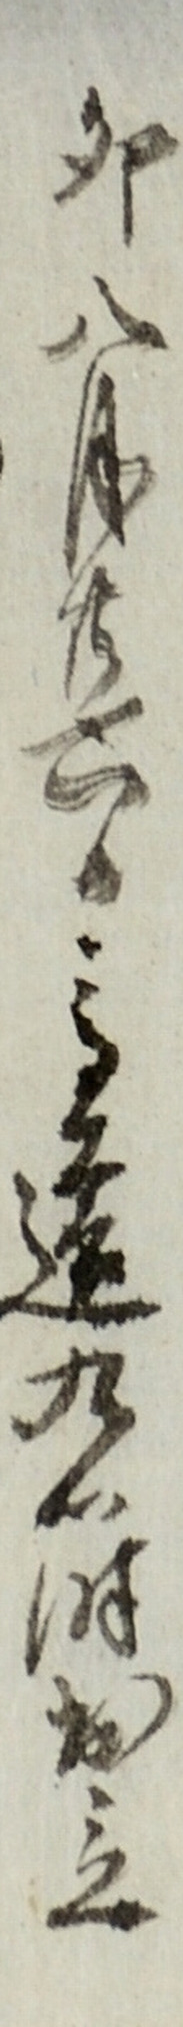卯八月廿六日高遠九ツ時出立
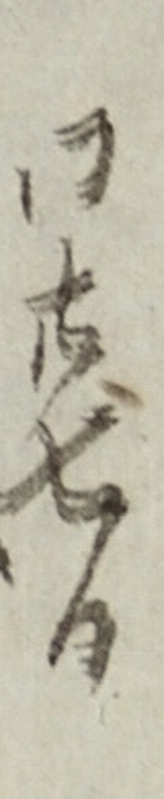同廿七日
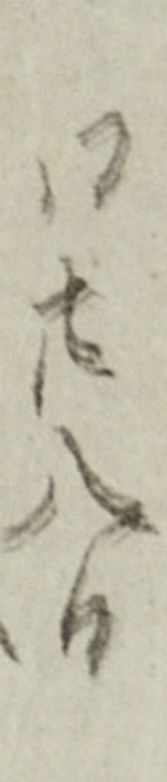同廿八日
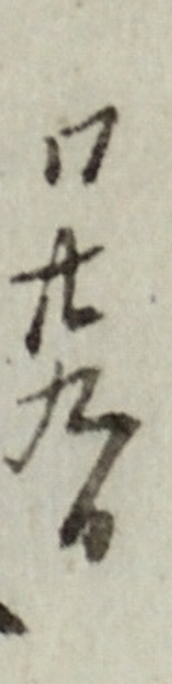同廿九日

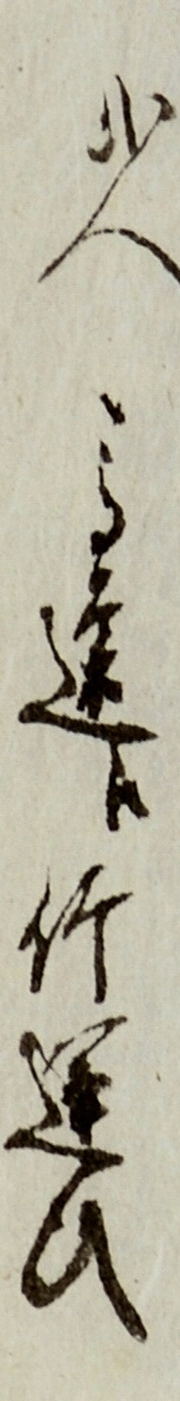弐人高遠江竹運ひ
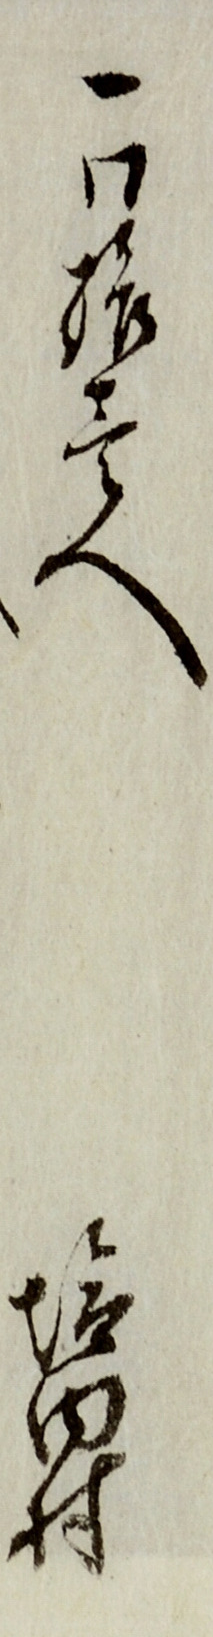一同拾壱人塩田村
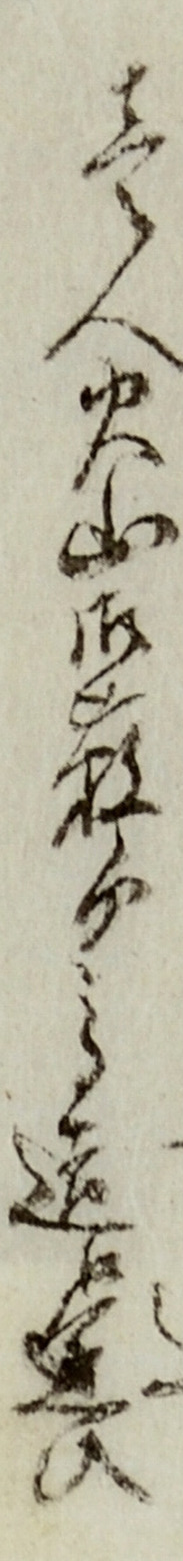壱人火山御籔ゟ高遠江運ひ
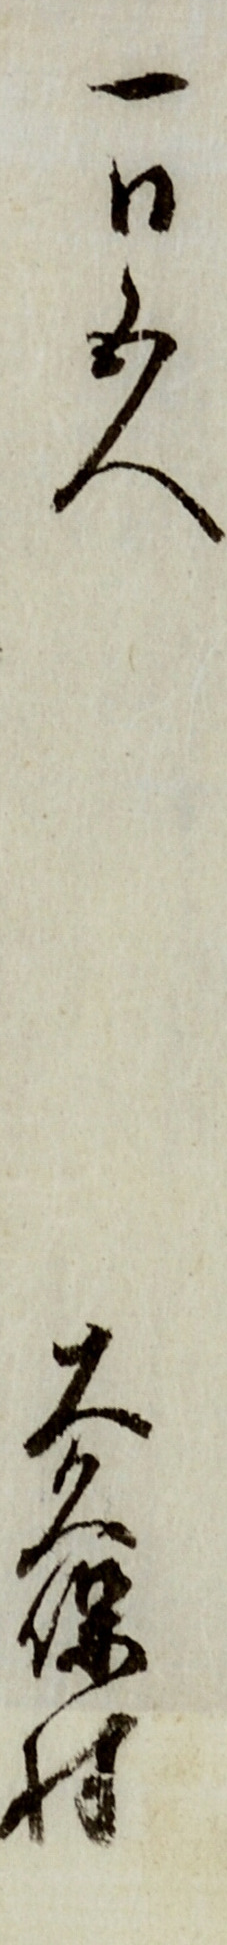一同五人大久保村
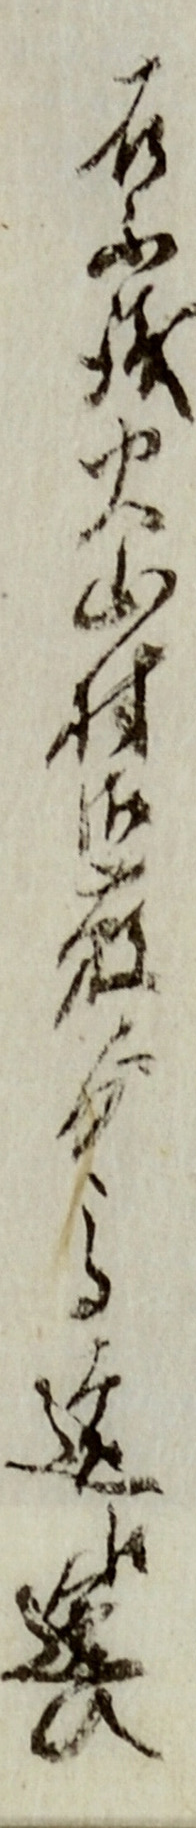右不残火山村御籔ゟ高遠江運ひ

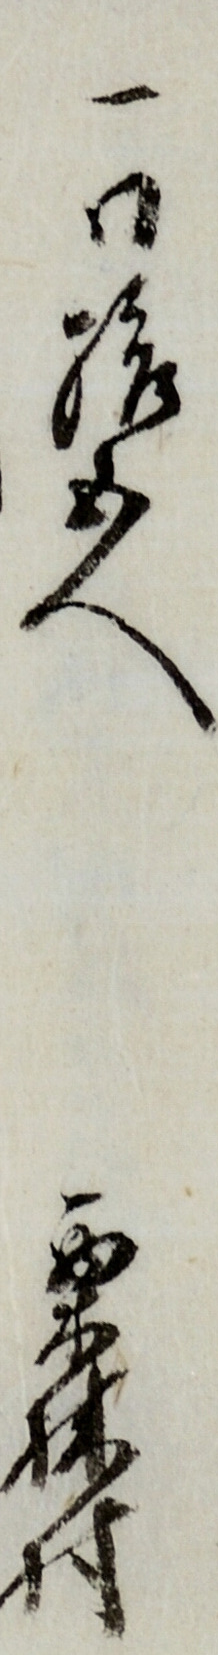一同拾五人栗林村
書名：中沢郷御竹薮見廻り
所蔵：伊那市立高遠町図書館・合同会社AMANE
